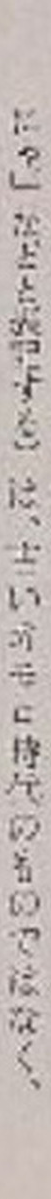にゃ」などと表記する)は、古いオモロ時代のものではなく、
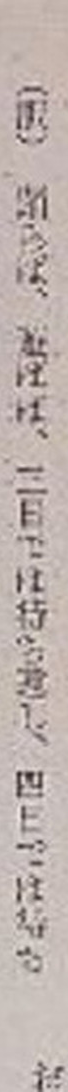(訳)踊らば、遊はば、三日では待ち遠し、四日では待ち
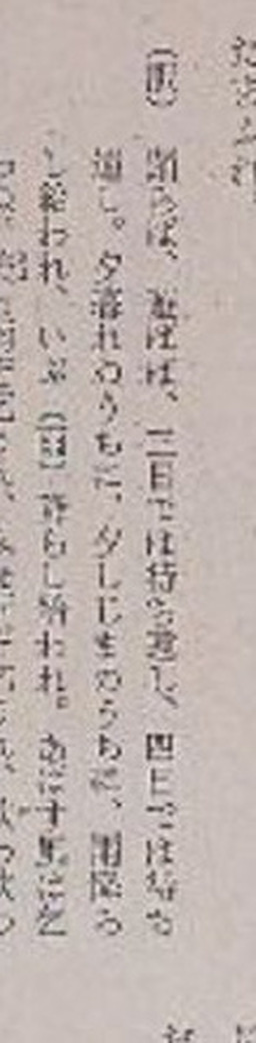遠し。夕暮れのうちに、夕しじまのうちに、雨降ろ
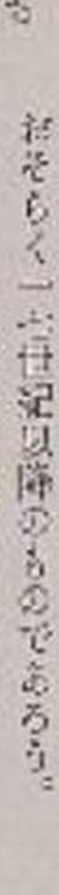おそらく一七世紀以降のものであろう。
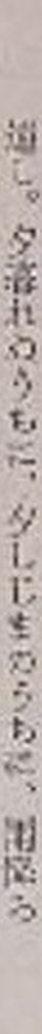遠し。夕暮れのうちに、夕しじまのうちに、雨降ろ
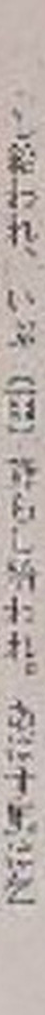し給われ、いぶ(雨)降らし給われ。あばす風は乞
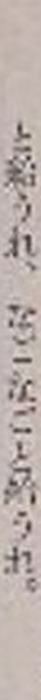と給うれ、なごなごと給うれ。
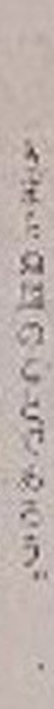きまらぬ風のことであろう。
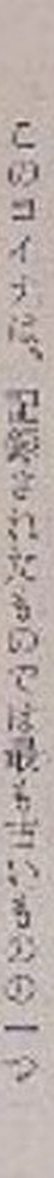このコイナは、記録されたものでは最も古いものの一つ
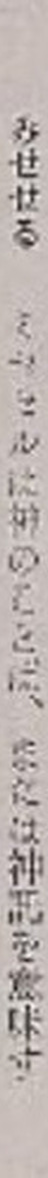みせせるミセセルは神のことば、または神語を意味す
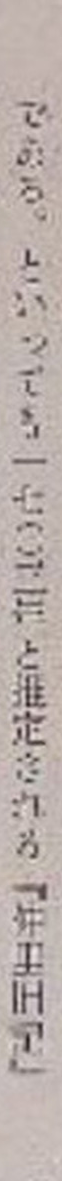である。といっても一七〇三年と推定される『仲里旧記』
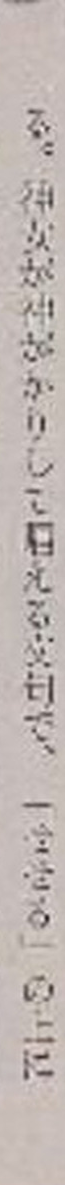す。神女が神がかりして唱える文句で、「せせる」の上に
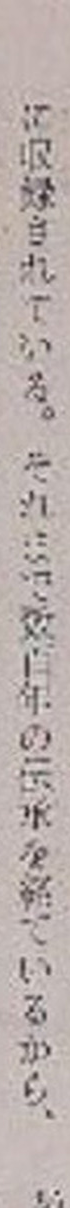に収録されている。それまで数百年の伝承を経ているから、
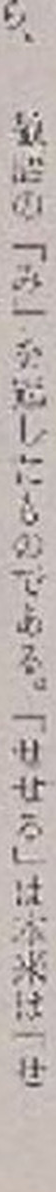敬語の「み」を冠したものである。「せせる」は本来は「せ
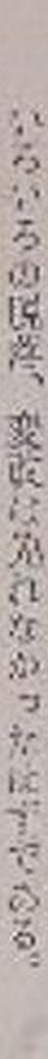いろいろの脱落、変改は免れなかったはずである。
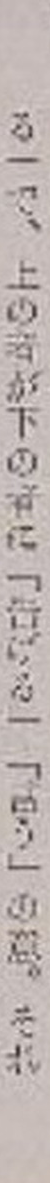る」で、上の者が下の者に「告げる」「言う」の意。それ
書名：沖縄口承文芸
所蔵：University of the Ryukyus Library
